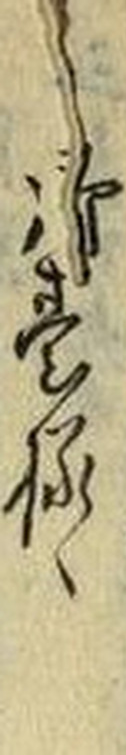御台様へ
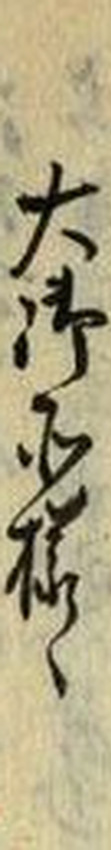大御所様へ
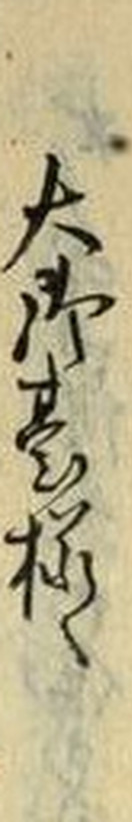大御台様へ
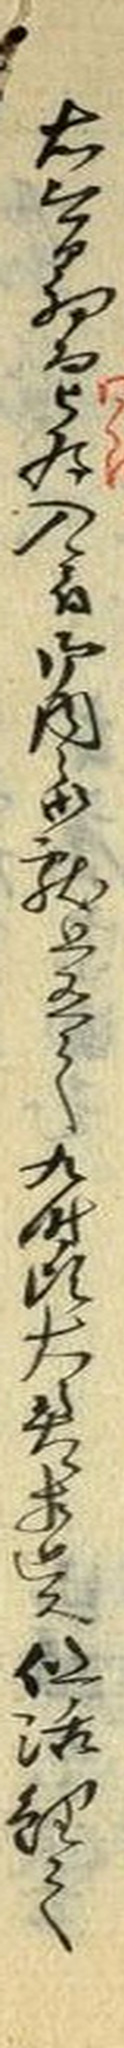右今日初而被為入候ニ付御内々献上有之九時頃大奥へ相廻ス但活鯉之
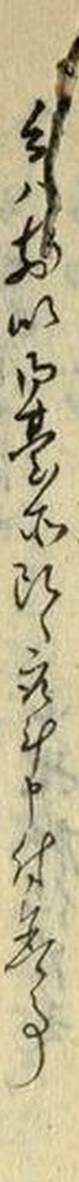分ハ前以御台所頭へ取斗申付置候事
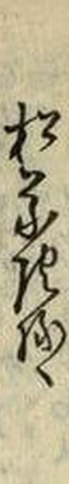松栄院様へ
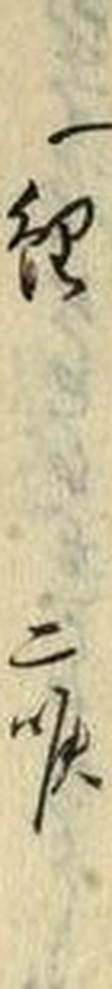鯉二喉
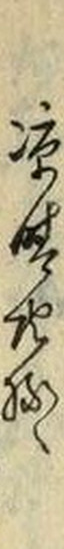涼晴院様へ
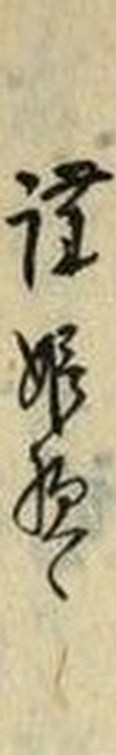謹姫様へ
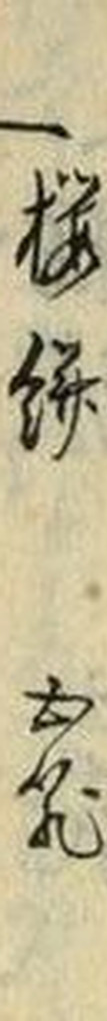桜餅五籠
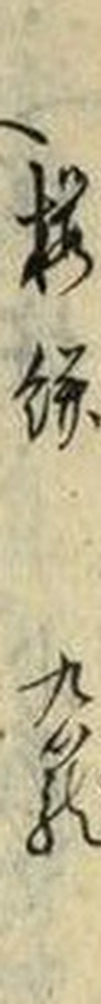桜餅九籠

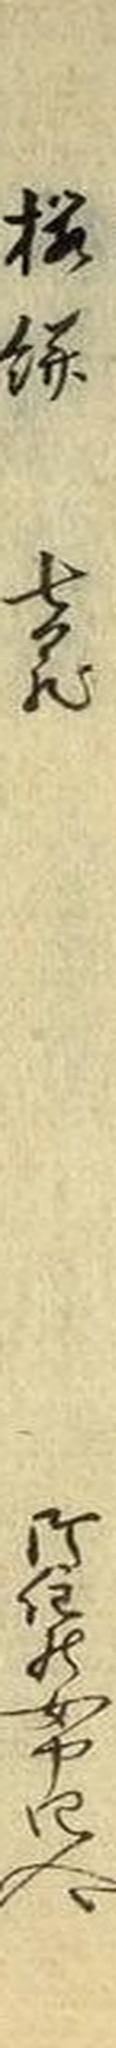桜餅七籠御住居女中四人へ
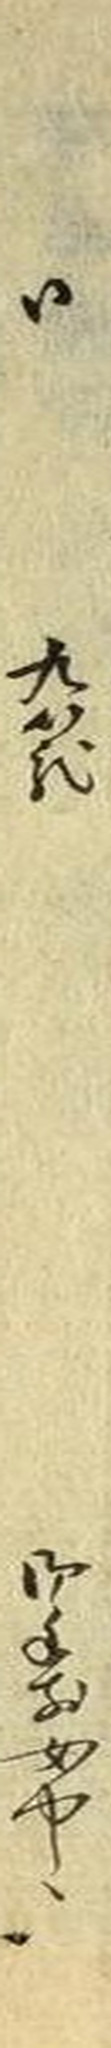同九籠御手前女中へ
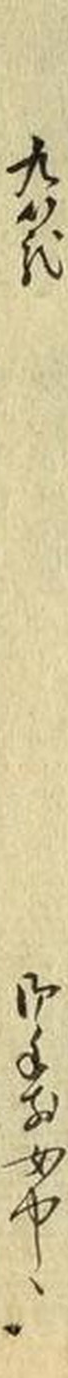同九籠御手前女中へ
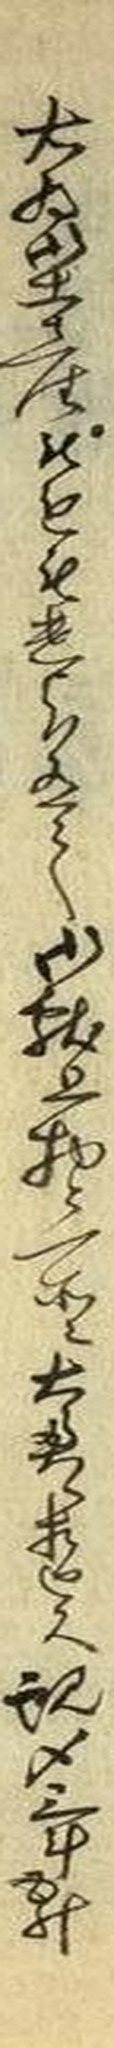右為御土産被進被遣被下有之御献上物と一所ニ大奥へ相廻ス
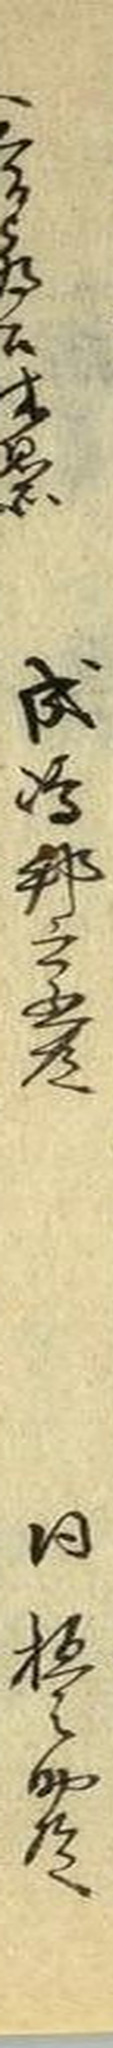今日被為召休息所成嶋邦之丞殿同桓之助殿
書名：少傅日録抄（斉善付側向頭取日記、江戸并道中、初入在国、逝去後…
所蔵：福井県文書館 Fukui Prefectural Archives
